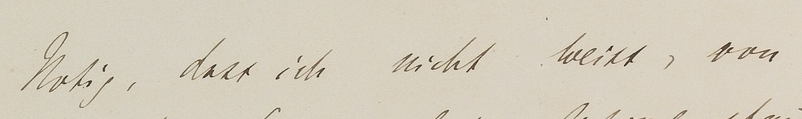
Notiz, dass ich nicht weiss, von
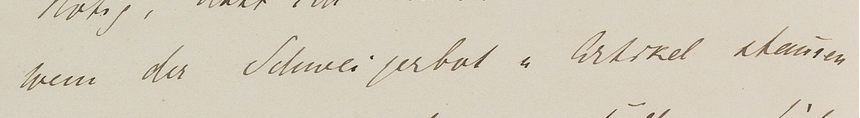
wem der Schweizerbot-Artikel stammen
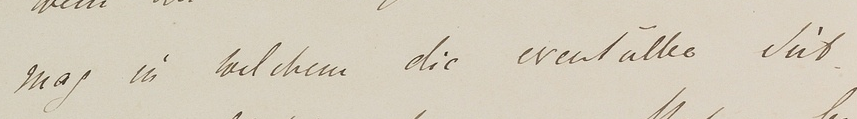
mag in welchem die eventuelle Sub-
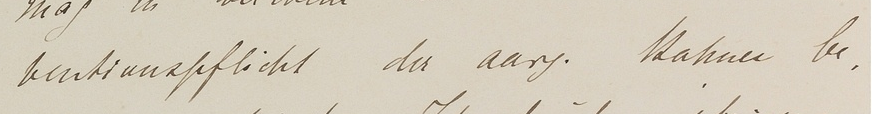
ventionspflicht der aarg. Bahnen be-
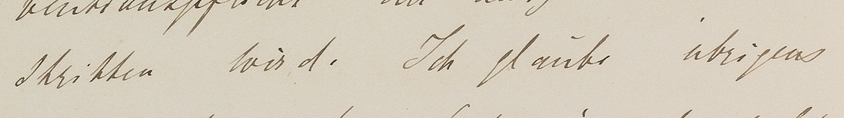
stritten wird. Ich glaube übrigens
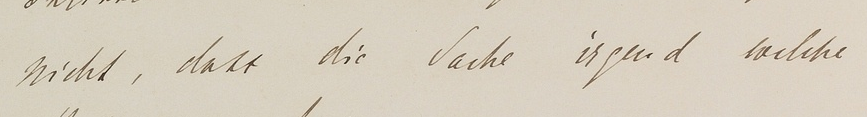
nicht, dass die Sache irgend welche
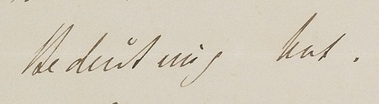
Bedeutung hat.
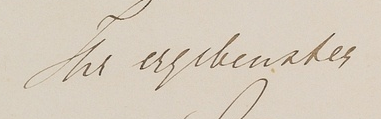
Ihr ergebenster
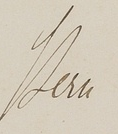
Bern
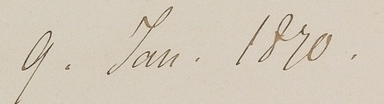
9. Jan. 1870.
